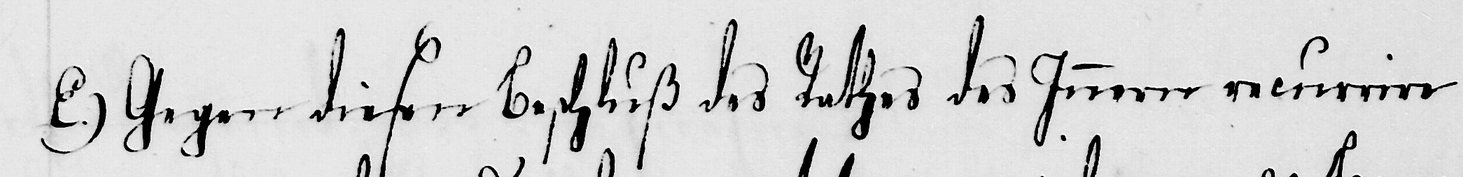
E.) Gegen diesen Beschluß des Rathes des Innern recurrire
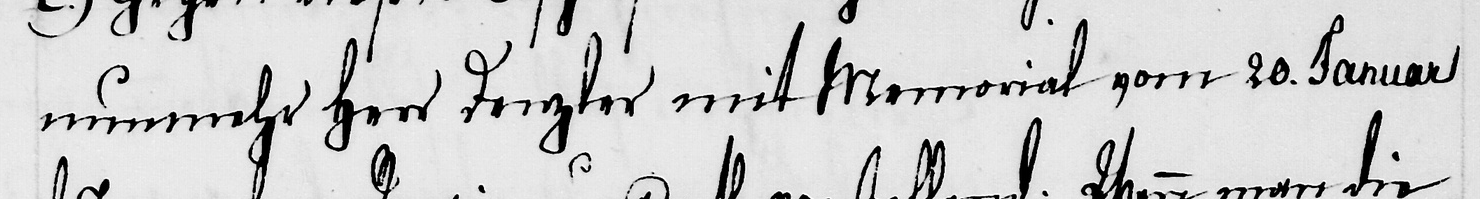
nunmehr Herr Denzler mit Memorial vom 20. Januar
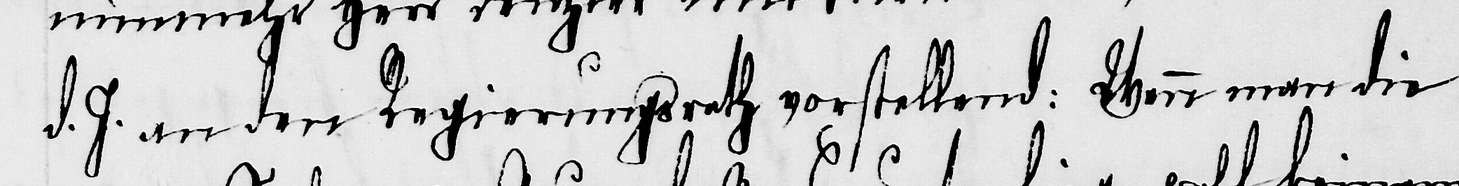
d. J. an den Regierungsrath vorstellend: Wenn man die
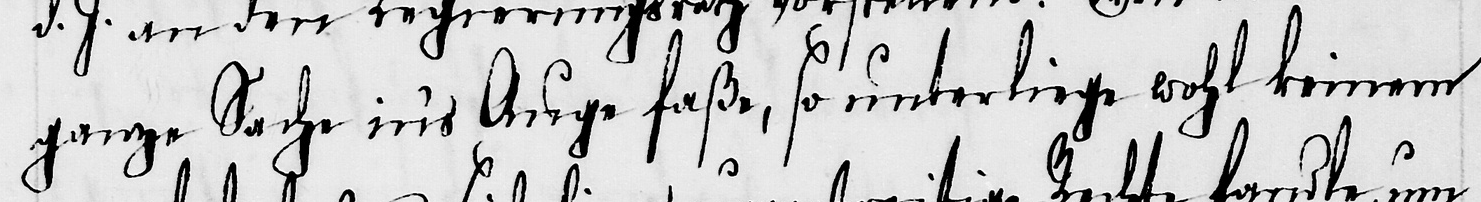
ganze Sache ins Auge faße, so unterliege wohl keinem
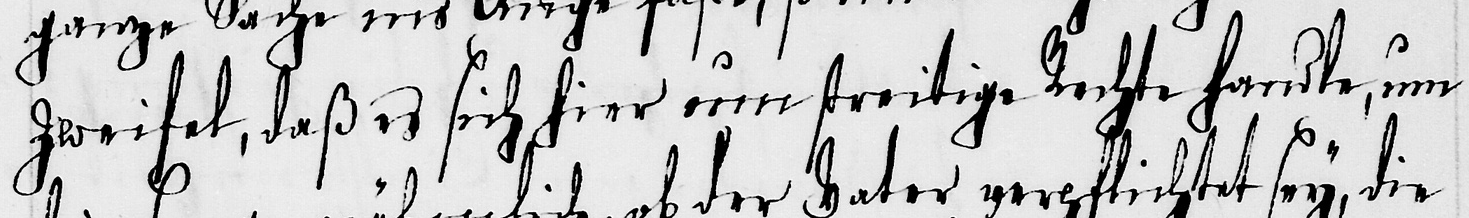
Zweifel, daß es sich hier um streitige Rechte handle, um
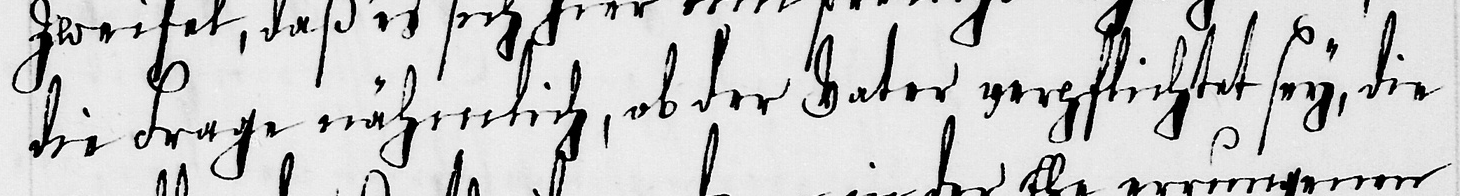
die Frage nähmlich, ob der Vater verpflichtet sey, die
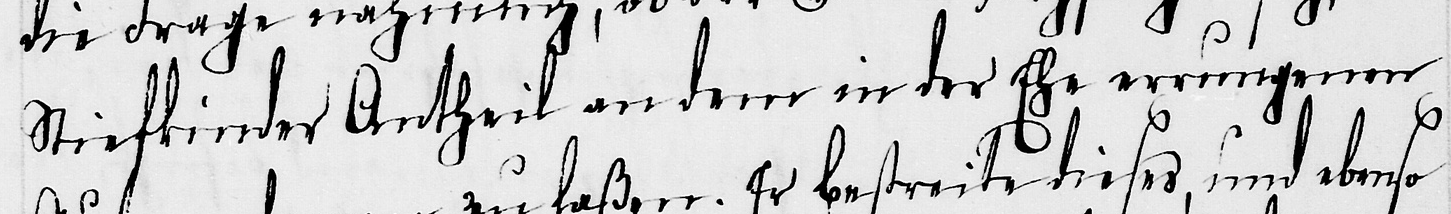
Stiefkinder Antheil an dem in der Ehe errungenen
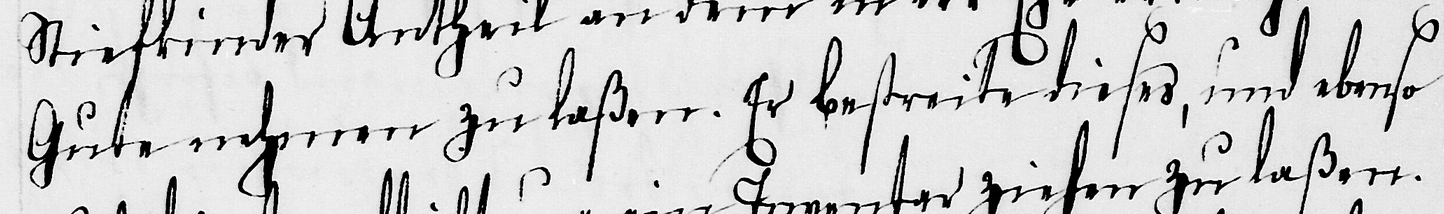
Gute nehmen zu laßen. Er bestreite dieses, und ebenso
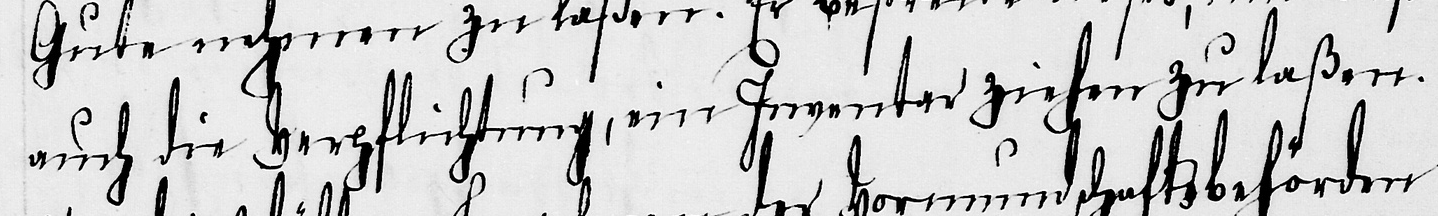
auch die Verpflichtung, ein Inventar ziehen zu laßen.
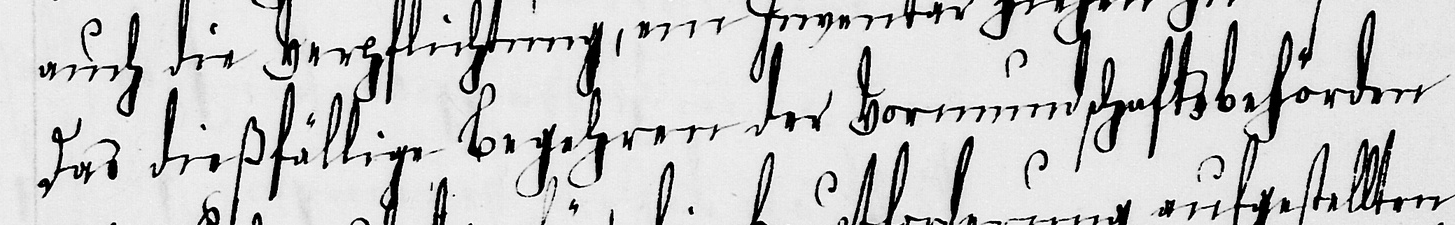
Das dießfällige Begehren der Vormundschaftsbehörden
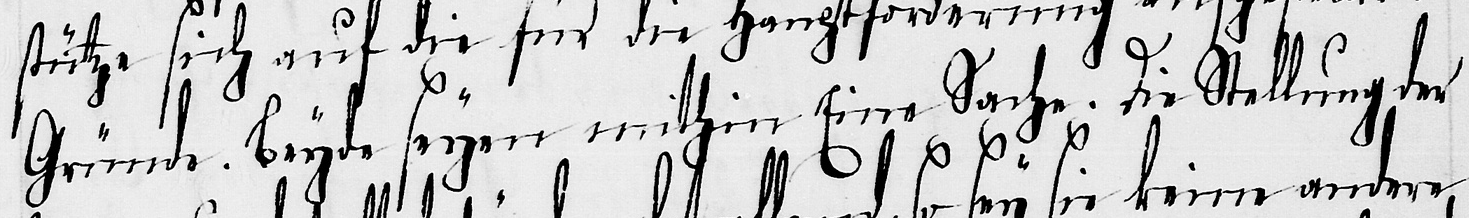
Gründe. Beyde seyen mithin Eine Sache. Die Stellung der
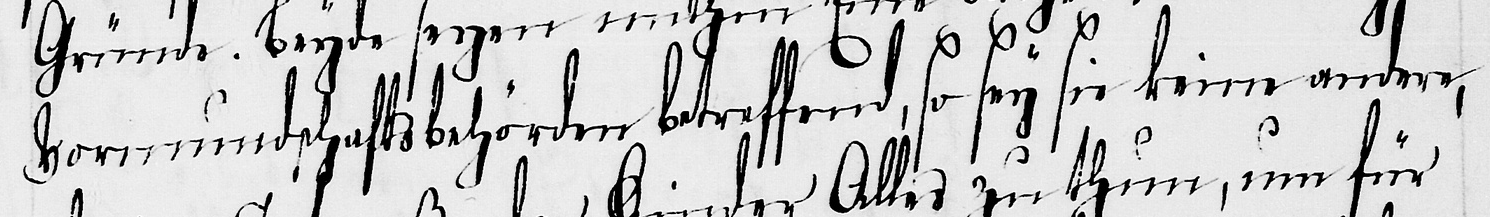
Vormundschaftsbehörden betreffend, so sey sie keine andere,
